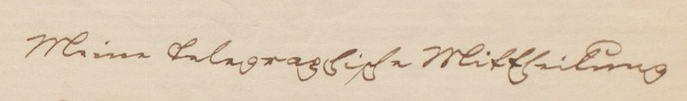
Meine telegraphische Mittheilung
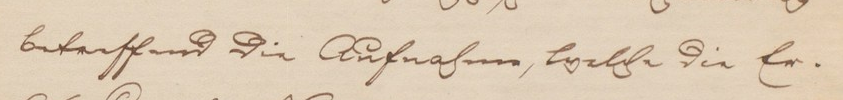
betreffend die Aufnahme, welche die Er-
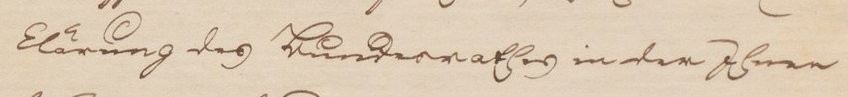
klärung des Bundesrathes in der Ihnen
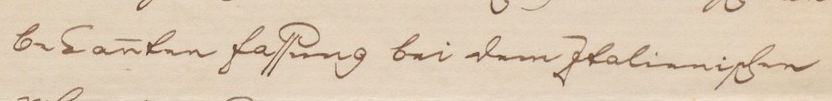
bekannten Fassung bei dem Italienischen
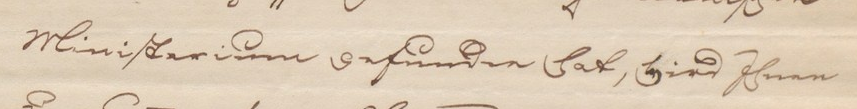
Ministerium gefunden hat, wird Ihnen
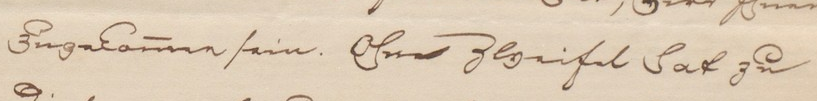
zugekommen sein. Ohne Zweifel hat zu
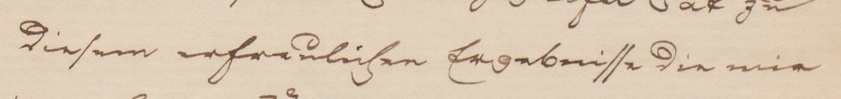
diesem erfreulichen Ergebnisse die mir
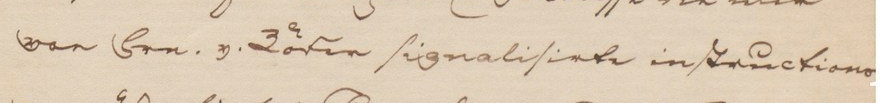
von Hrn. v. Röder signalisirte instructions-
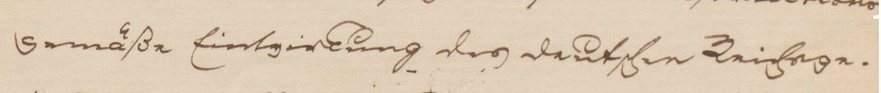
gemäße Einwirkung des deutschen Reichsge-
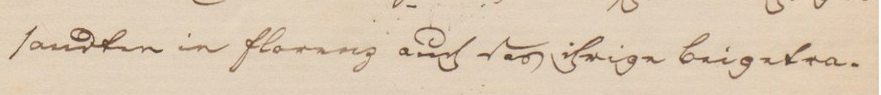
sandten in Florenz auch das ihrige beigetra-
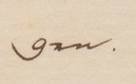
gen.
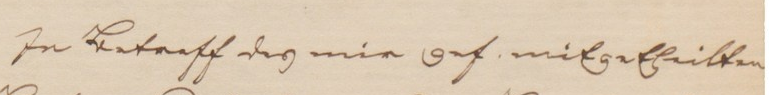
In Betreff des mir gef. mitgetheilten
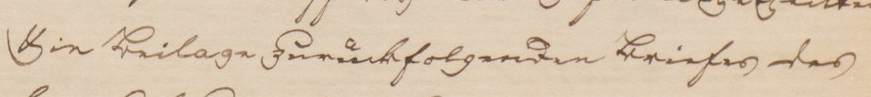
& in Beilage zurückfolgenden Briefes des
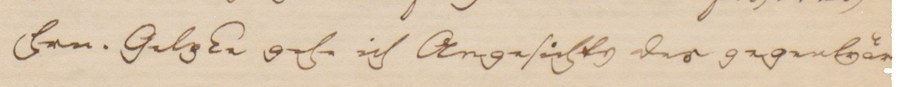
Hrn. Gelpke gehe ich Angesichts des gegenwär-
